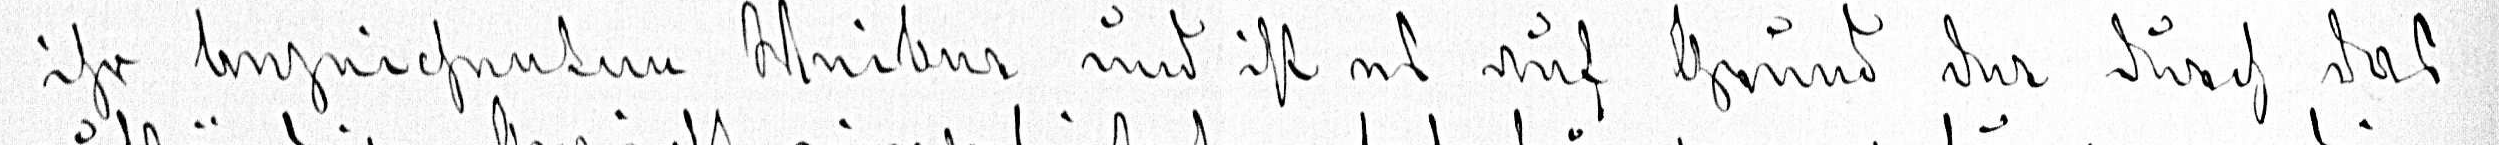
ihr bezeichneten Weiber und ist es auf Grund der durch das
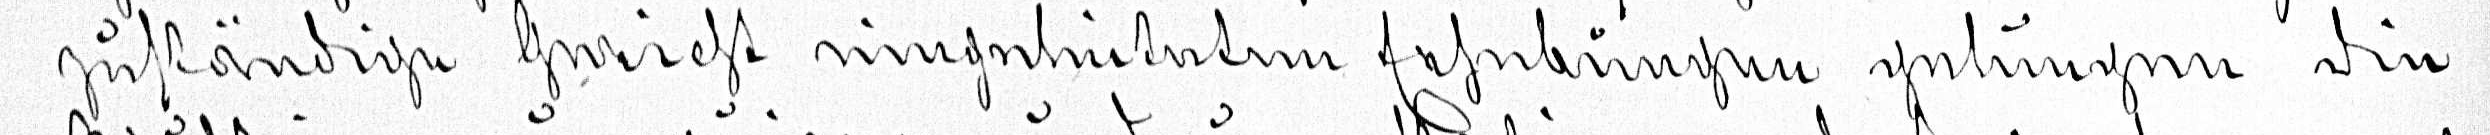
zuständige Gericht eingeleiteten Erhebungen gelungen die
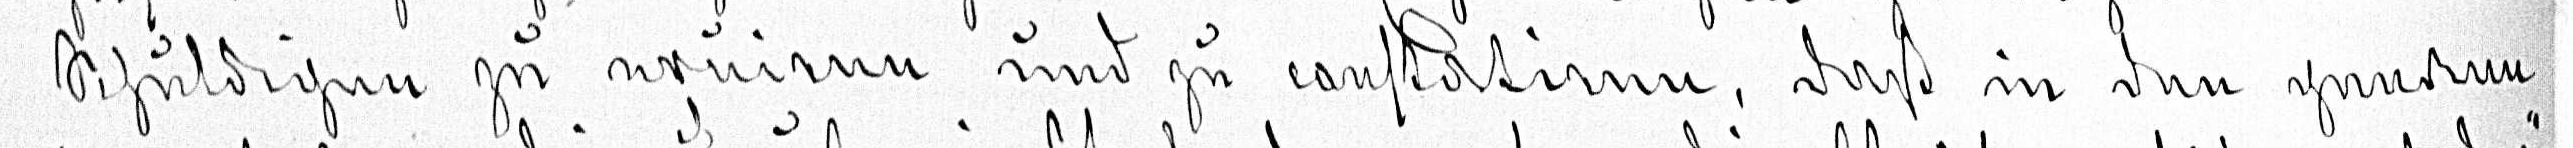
Schuldigen zu eruiren und zu constatiren, daß in den genann¬
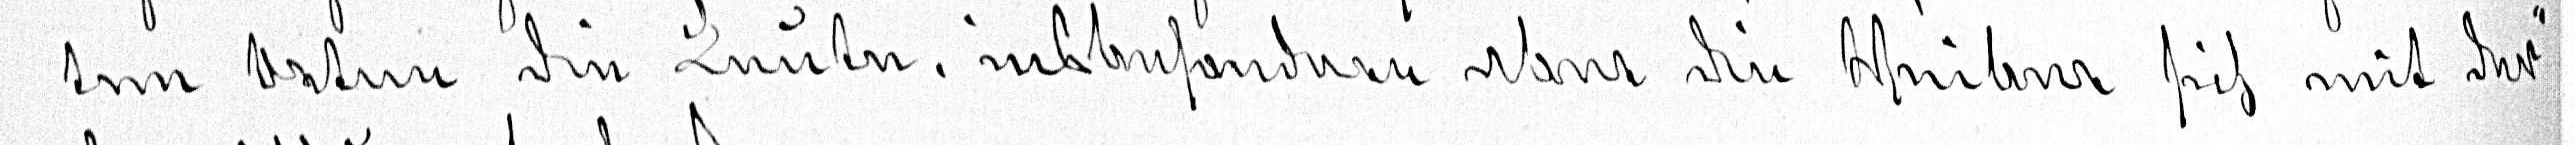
ten Orten die Leuten, insbesondere aber die Weiber sich mit der
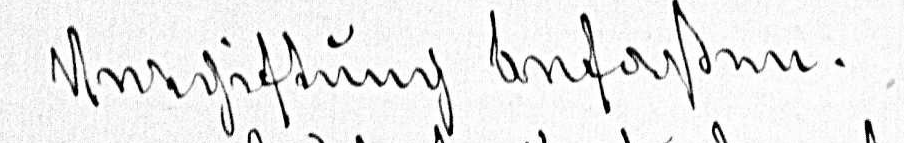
Vergiftung befaßen
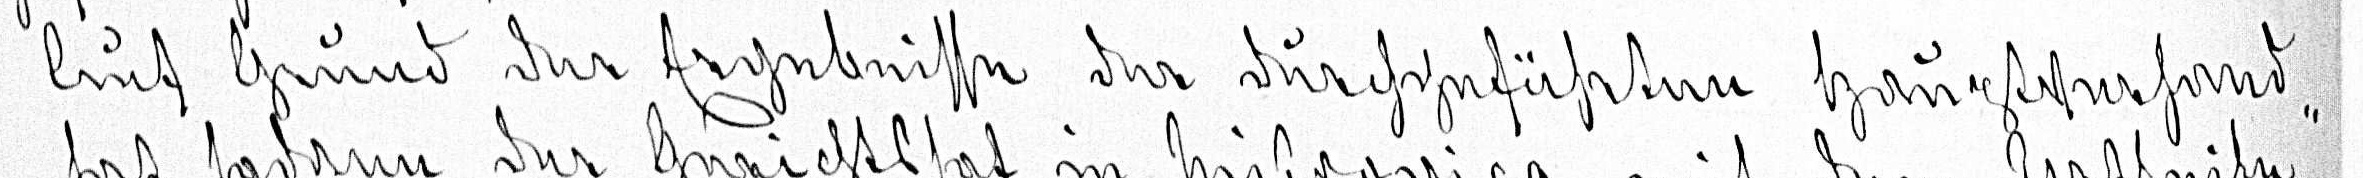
Auf Grund der Ergebnisse der durchgeführten Hauptverhand¬
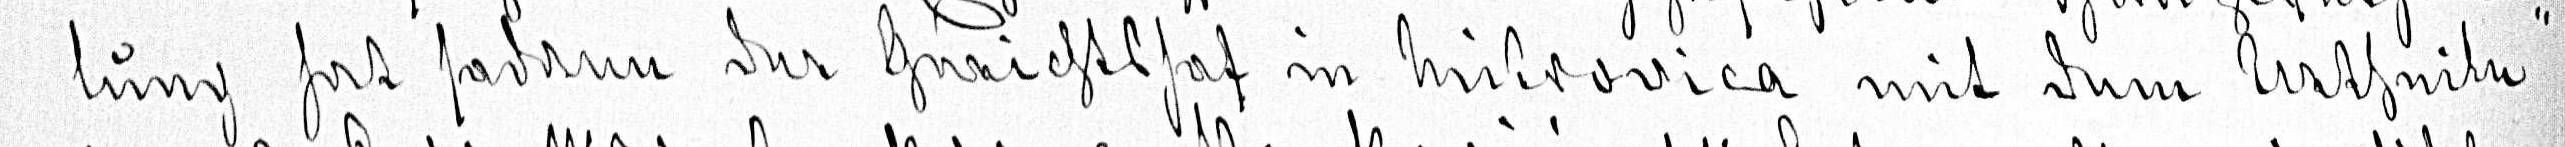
lung hat sodann der Gerichtshof in Mitrovica mit dem Urtheile
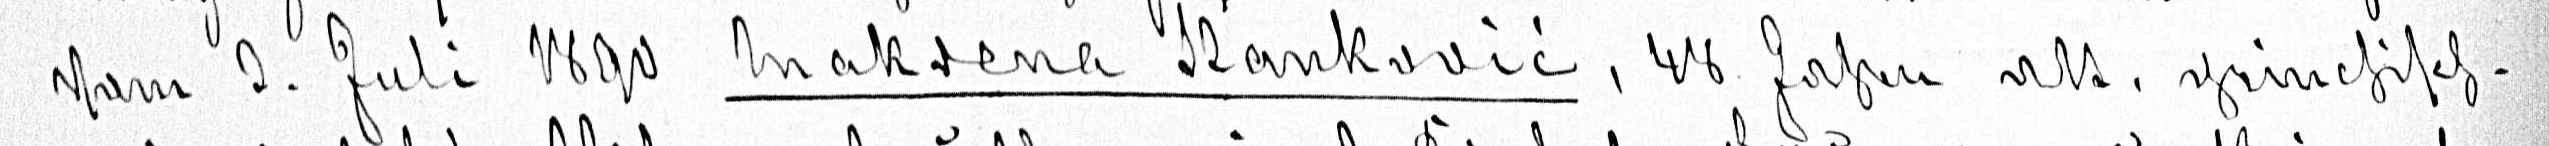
vom 3. Juli 1890 Makrena Skanković, 48 Jahre alt, griechisch-
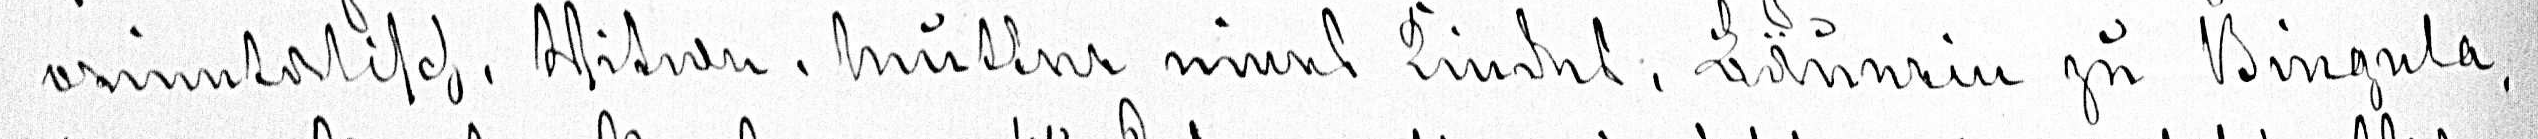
orientalisch, Witwe, Mutter eines Kindes, Bäuerin zu Bingula,
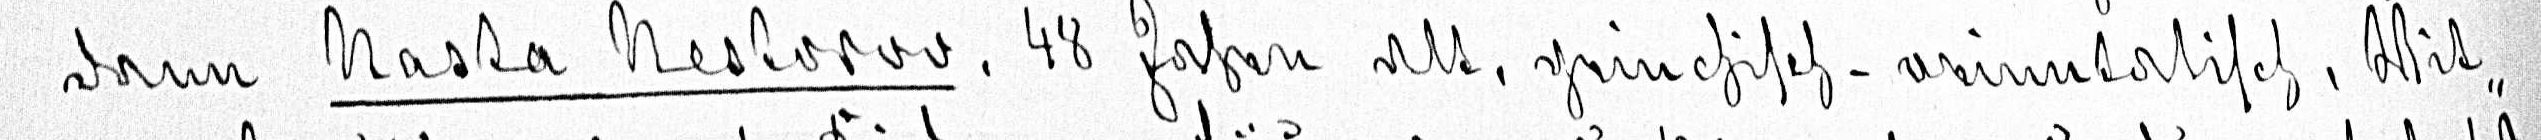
dann Nasta Nestorov, 48 Jahre alt, griechisch-orientalisch, Wit¬
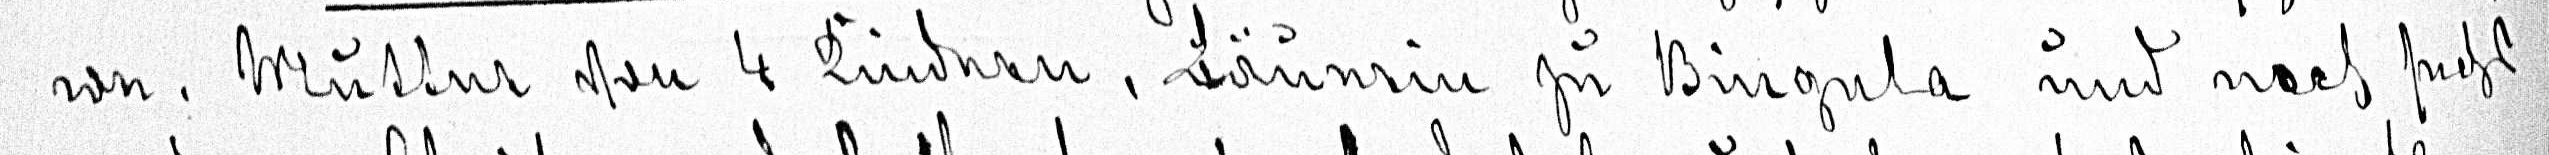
we, Mutter von 4 Kindern, Bäuerin zu Bingula und noch sechs
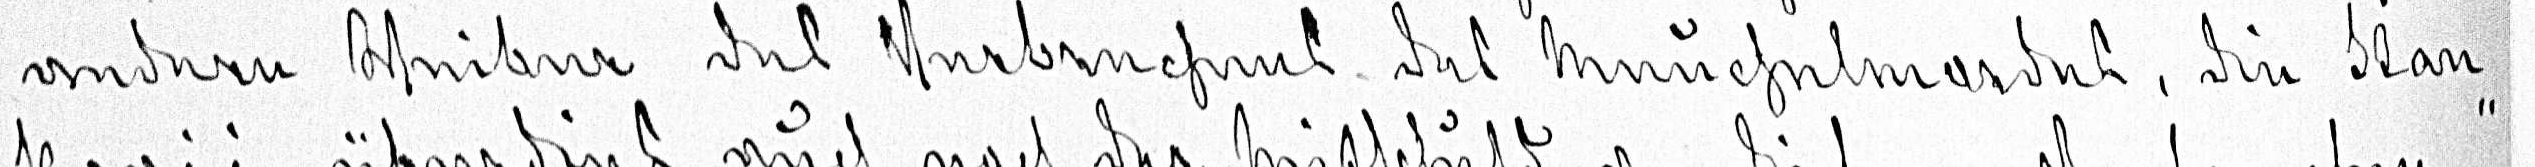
andere Weiber des Verbrechens des Meuchelmordes, die Skan¬
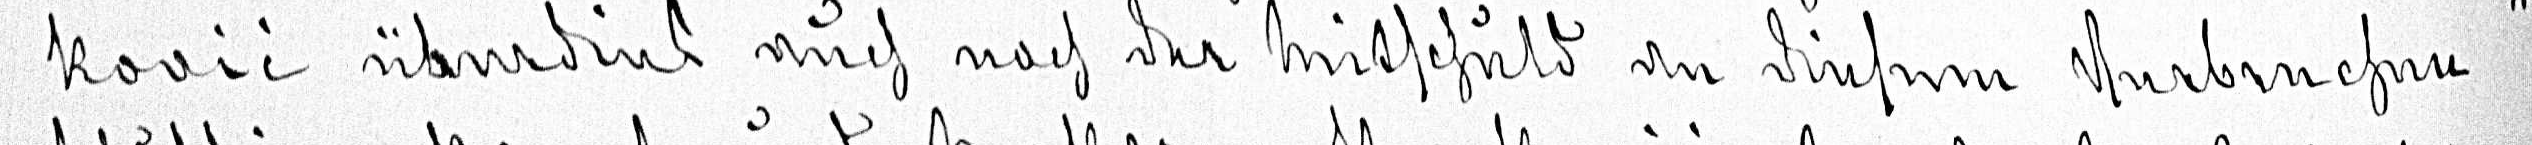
ković überdies auch noch der Mitschuld an diesem Verbrechen
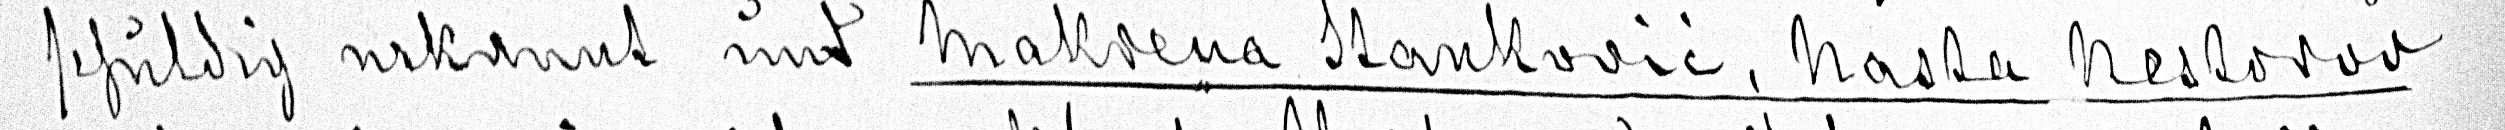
schuldig erkannt und Makrena Skanković, Nasta Nestorov
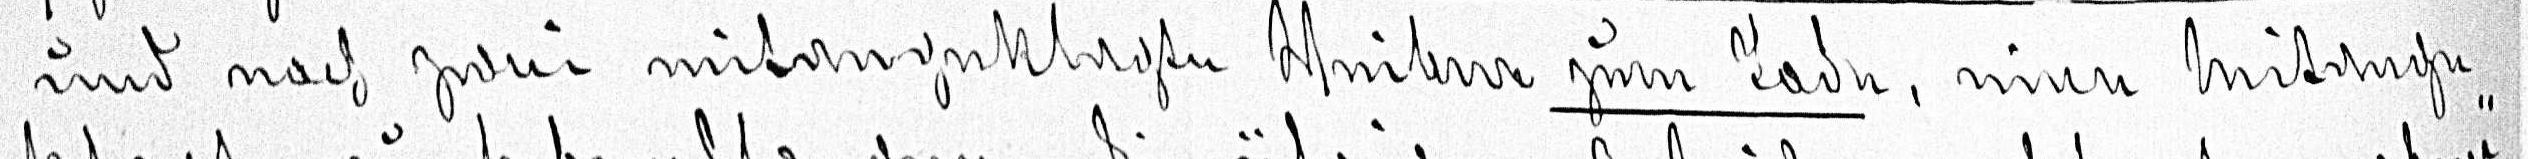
und noch zwei mitangeklagte Weiber zum Tode, eine Mitange¬
